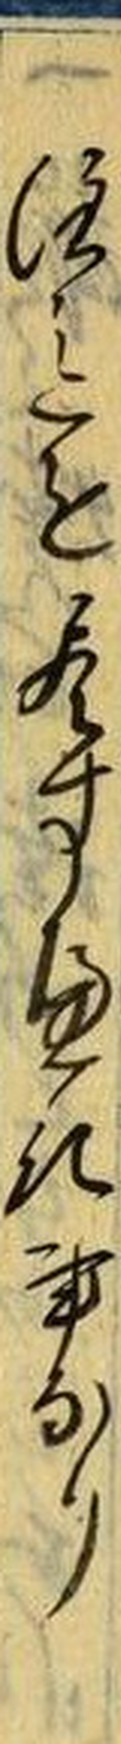注意を尽すへき事なり
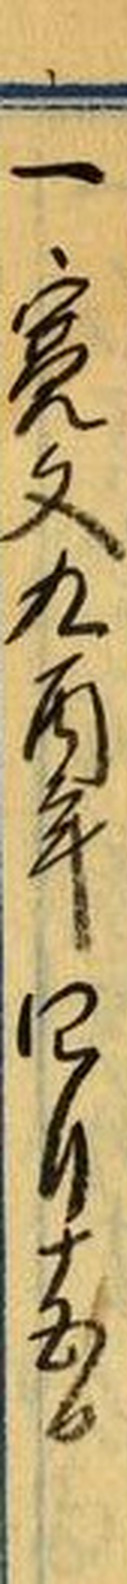一寛文九酉年四月十五日
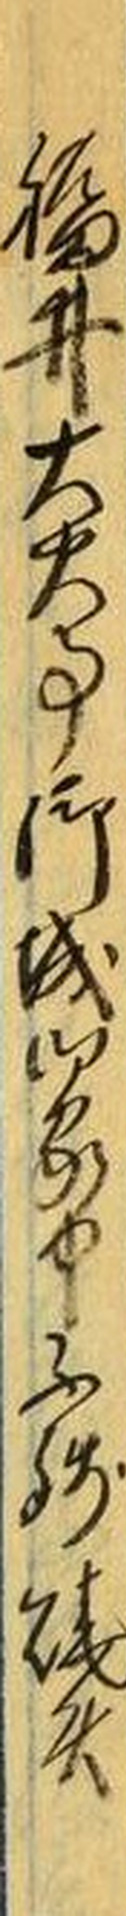福井大火事御城御家中不残焼失
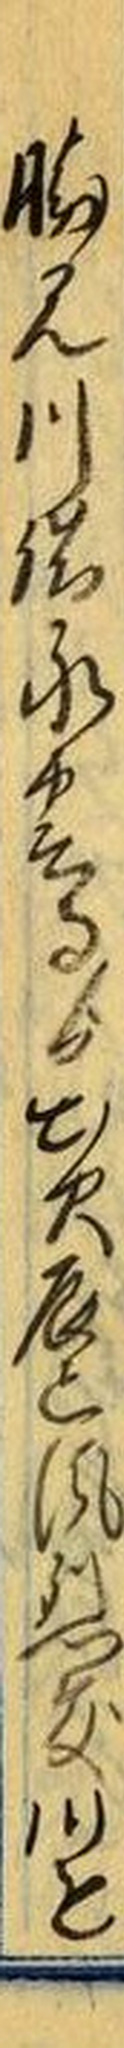勝見川端永雲寺ゟ出火辰巳風烈敷川を
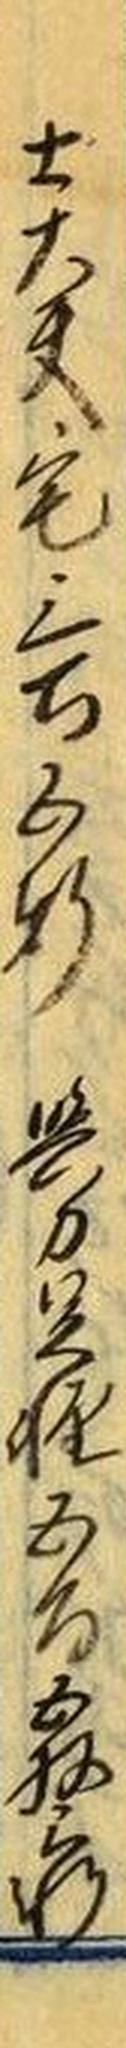士大夫宅三百五軒与力足軽五百五拾三軒
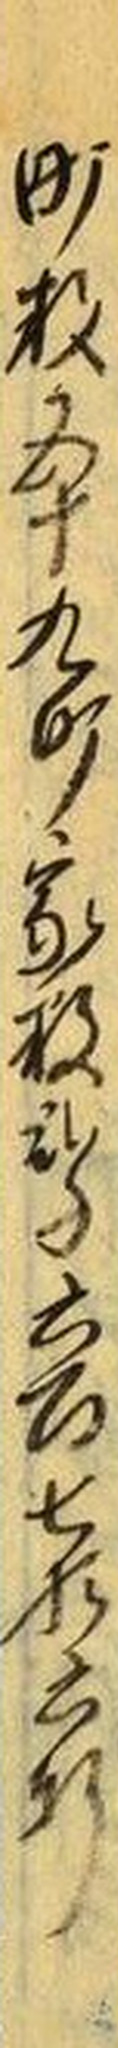町数五十九町家数弐千六百七拾六軒
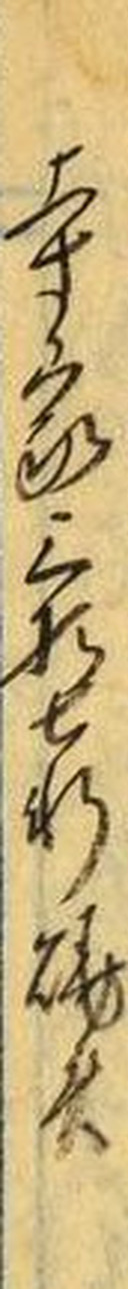寺家三拾七軒焼失

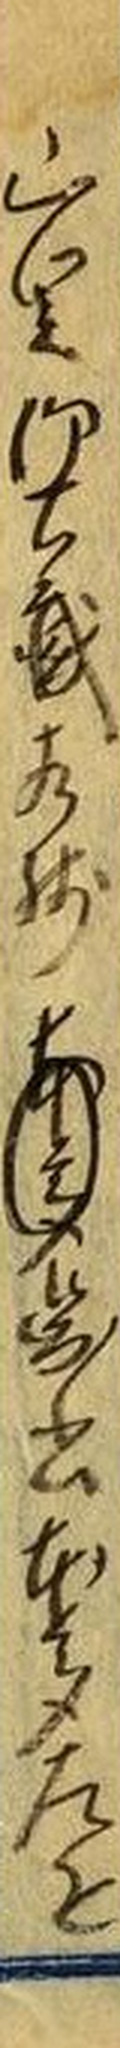山里御土蔵相残本多図書本多左近
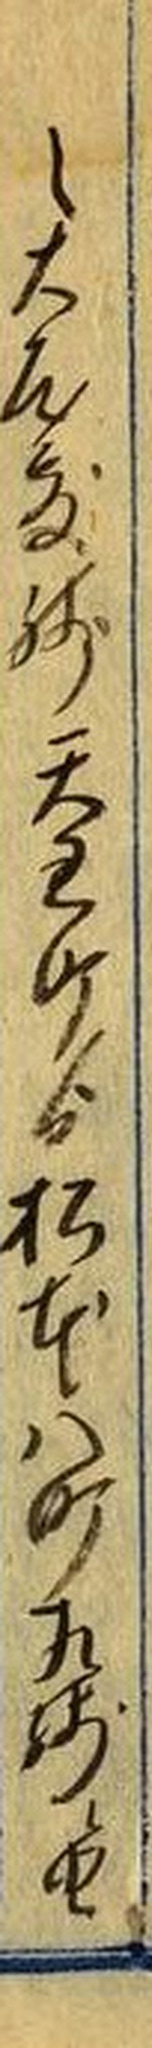之大屋敷残天王町ゟ松本八町相残候由
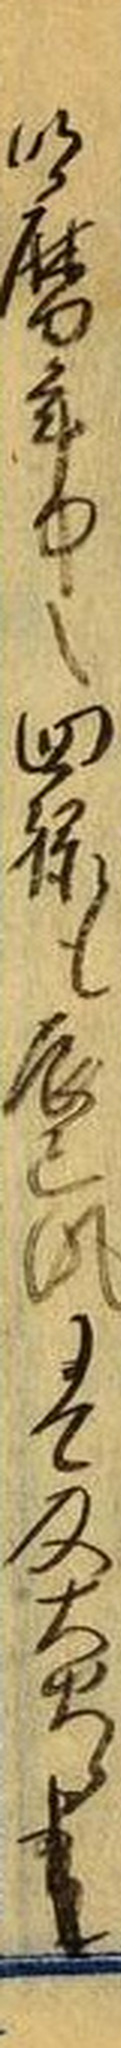明暦年中之回禄も辰巳風にて及大火候よし
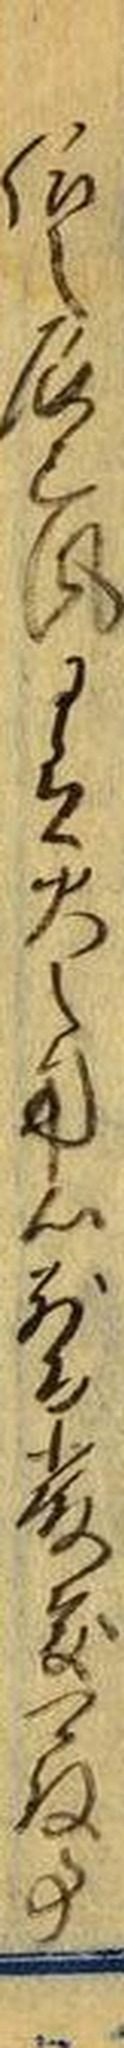依之辰巳風には火之用心別而厳敷可致事
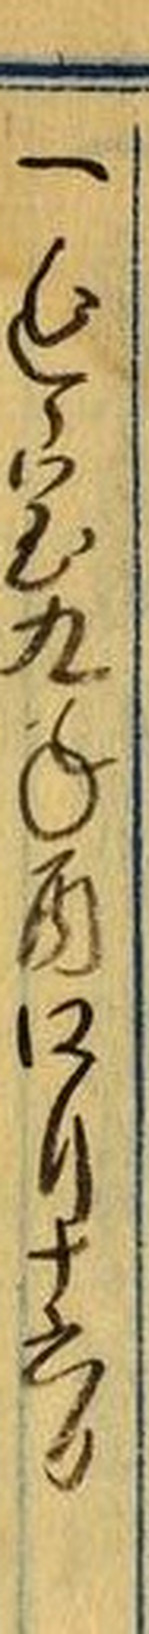一延宝九年酉四月十六日
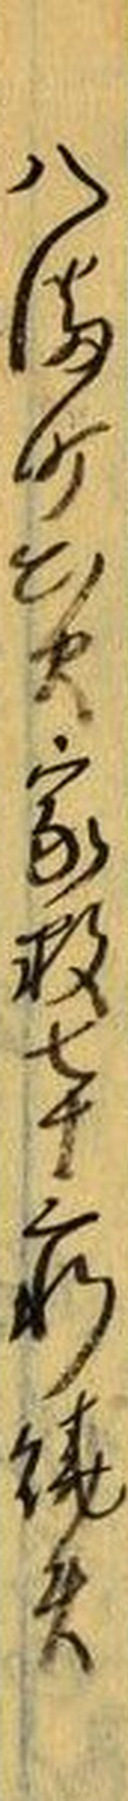八幡町出火家数七千三軒焼失
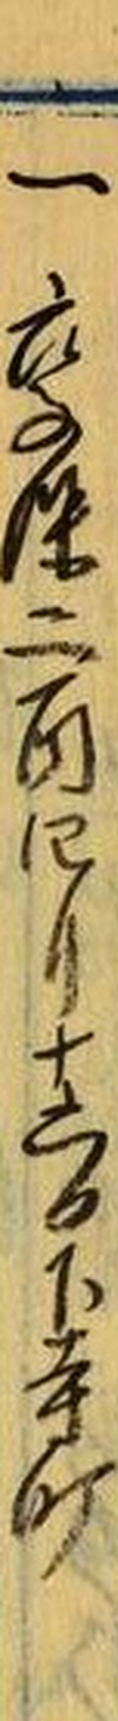一享保ニ酉四月十六日下寺町
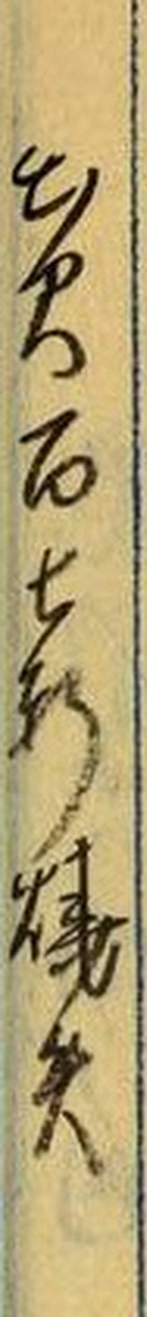出火百七軒焼失
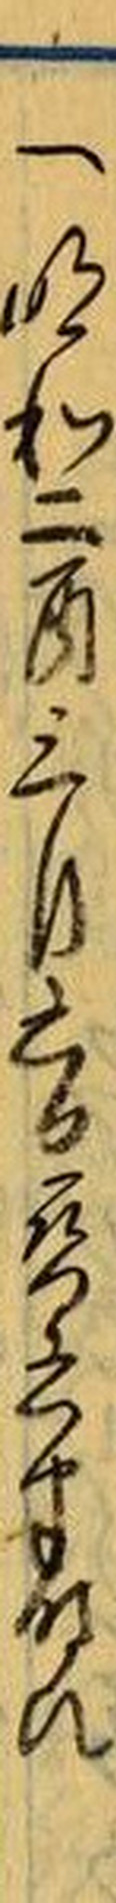一明和二酉三月六日暮六半時頃
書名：温古集 五巻
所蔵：福井県文書館 Fukui Prefectural Archives
